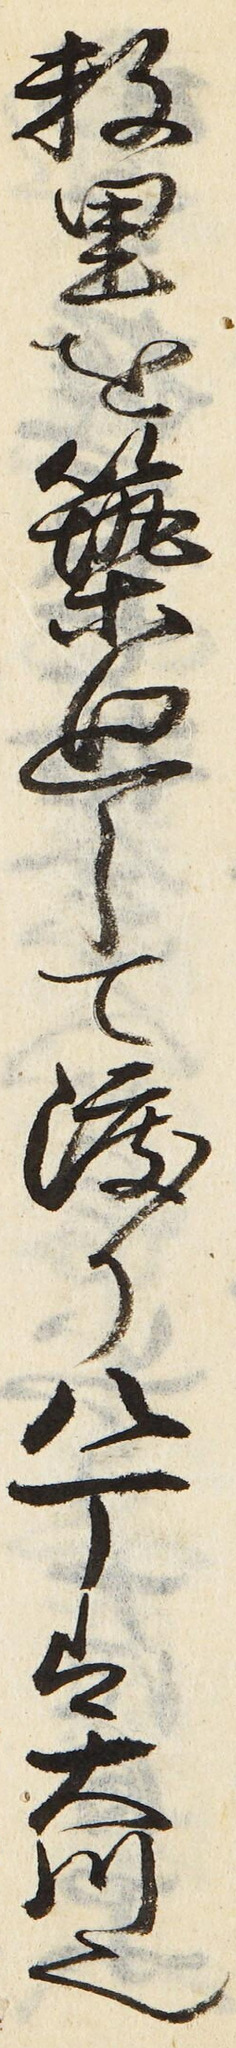数里を築廻して渡り八丁は大川也
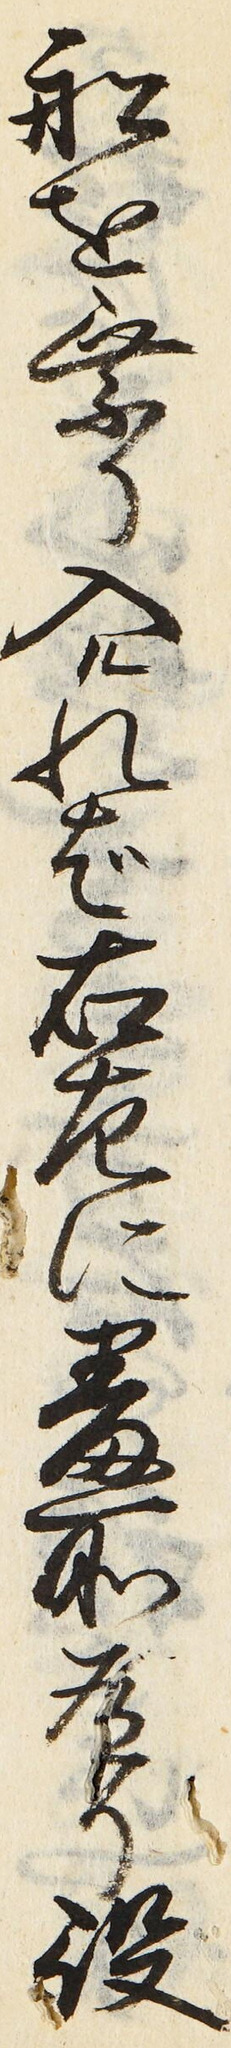船を乗り入るれば右左に番所有り役
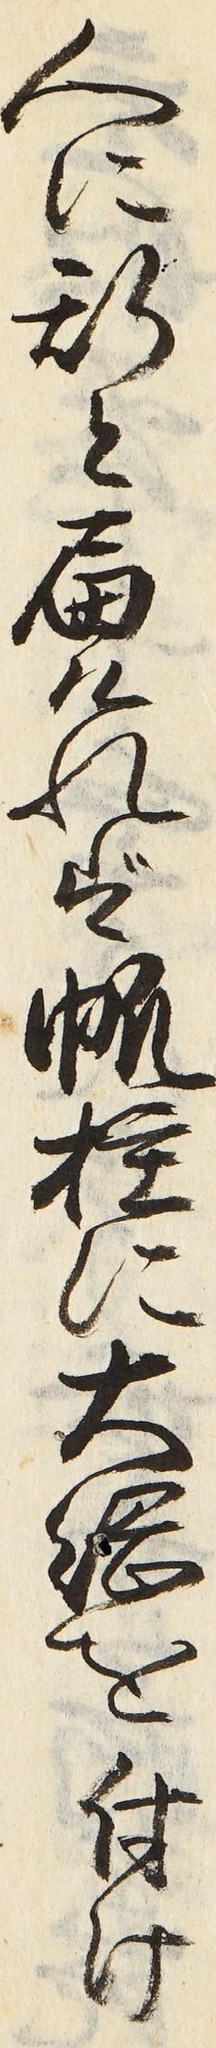人に斯と届ければ帆柱に大綱を付け
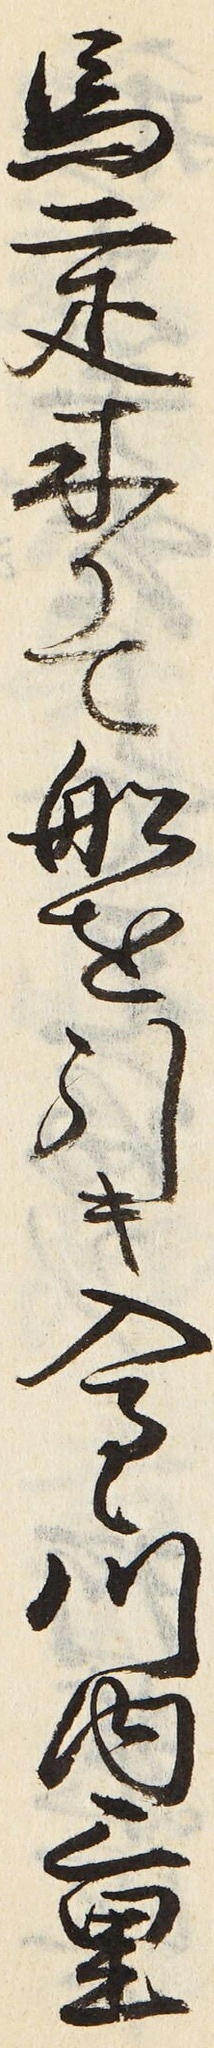馬二疋来りて船を引き入るゝ川内三里
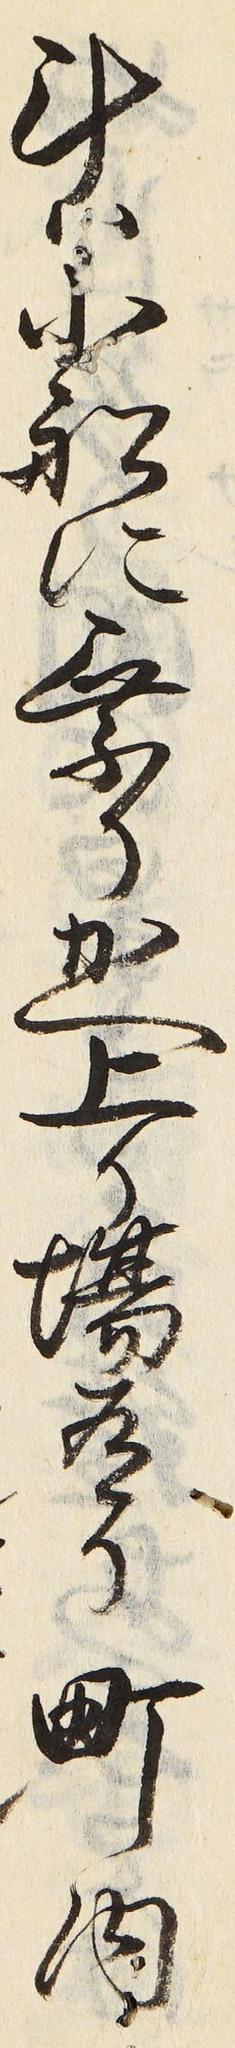計は小船に乗りかへ上り場有り町内
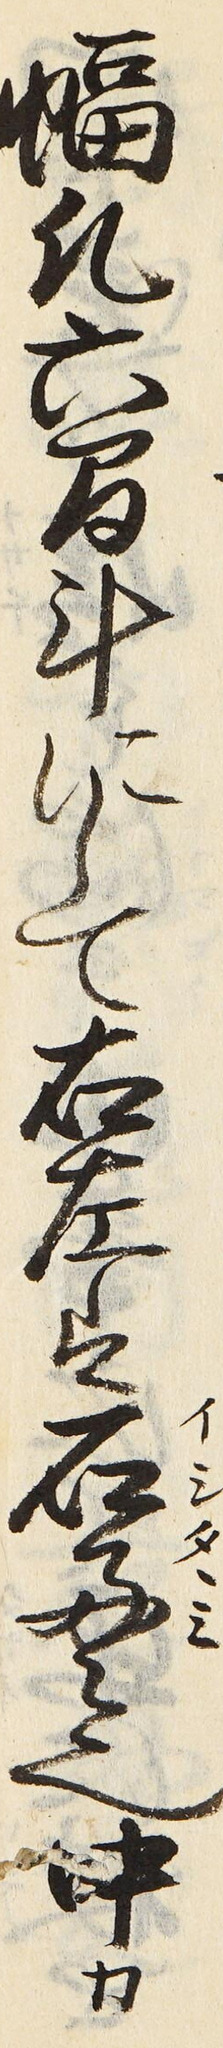幅凡六間計にして右左は石畳也中か
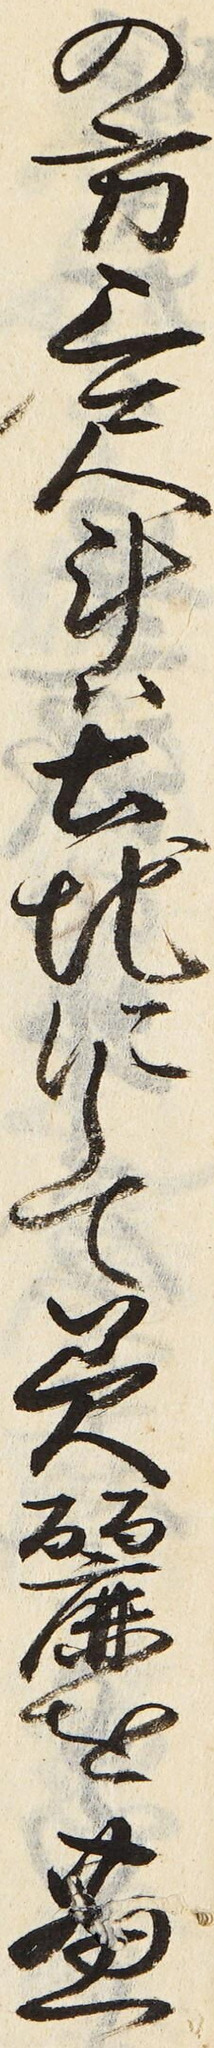の方三尺計は土地にして美麗を尽
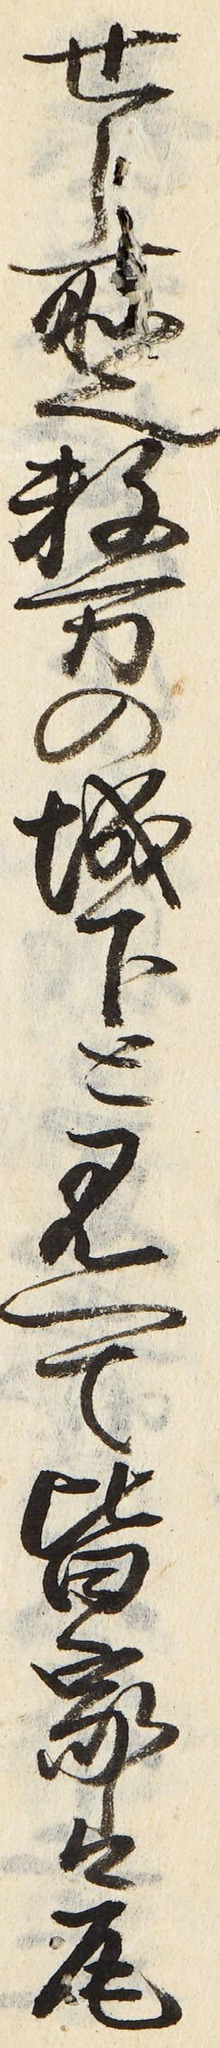せし所也数万の城下と見へて皆家は瓦
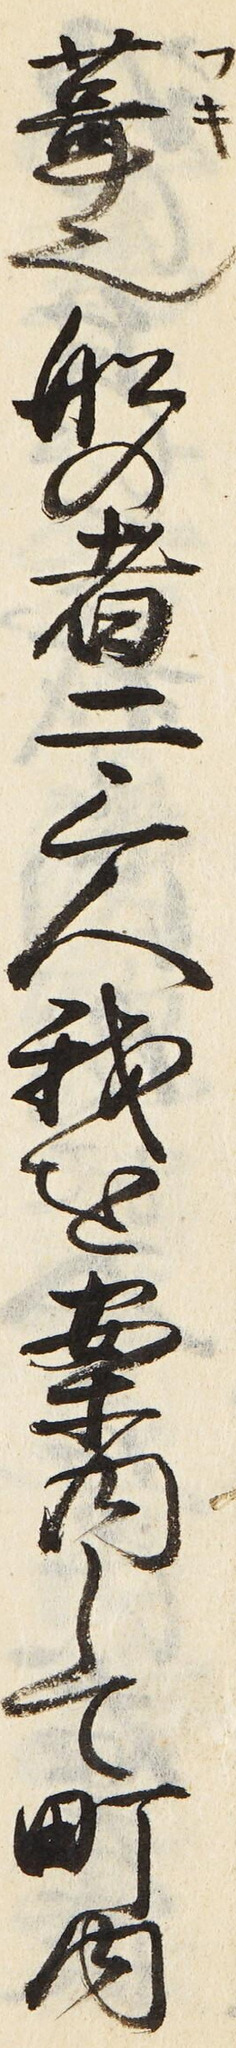葺也船の者二三人我を案内して町内
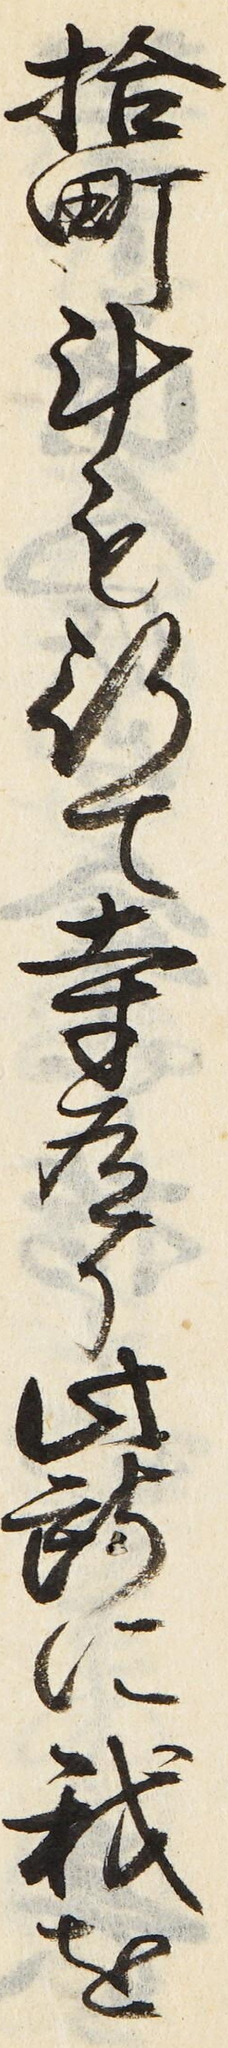拾町計も行て寺有り此所に我を
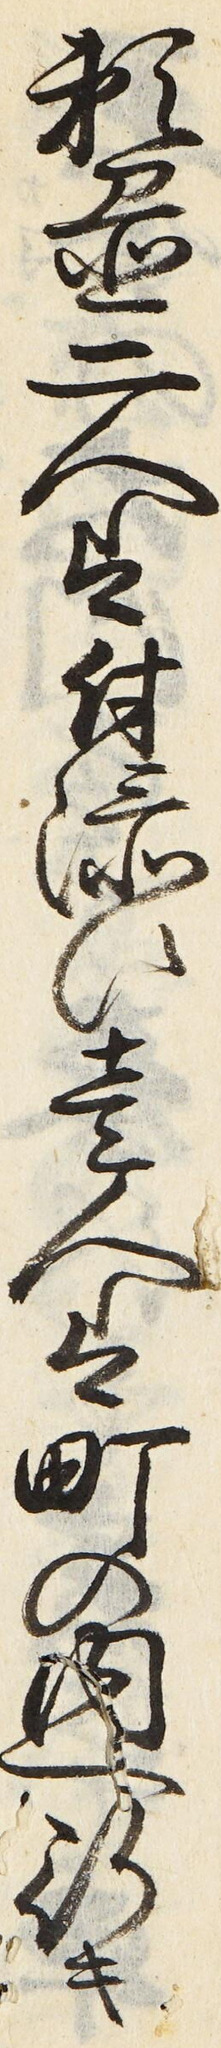頼置二人は付添ひ壱人は町の内へ行き
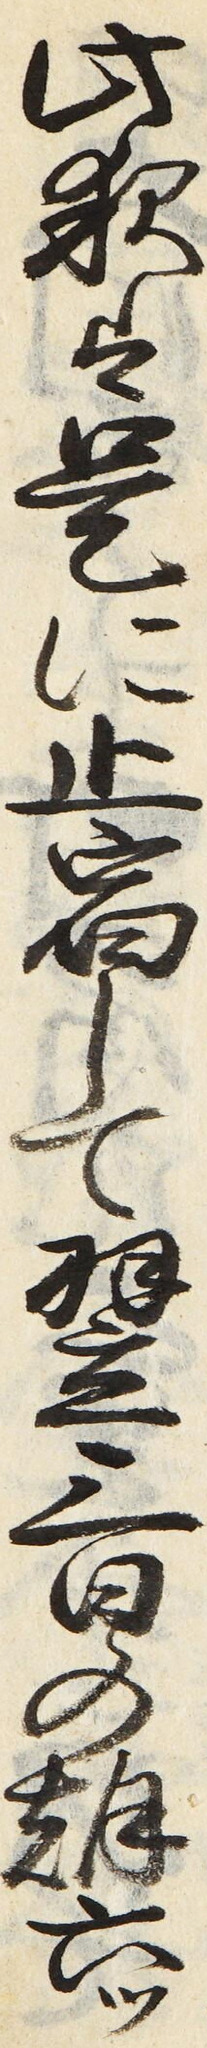此夜は是に止宿して翌三日の朝六つ
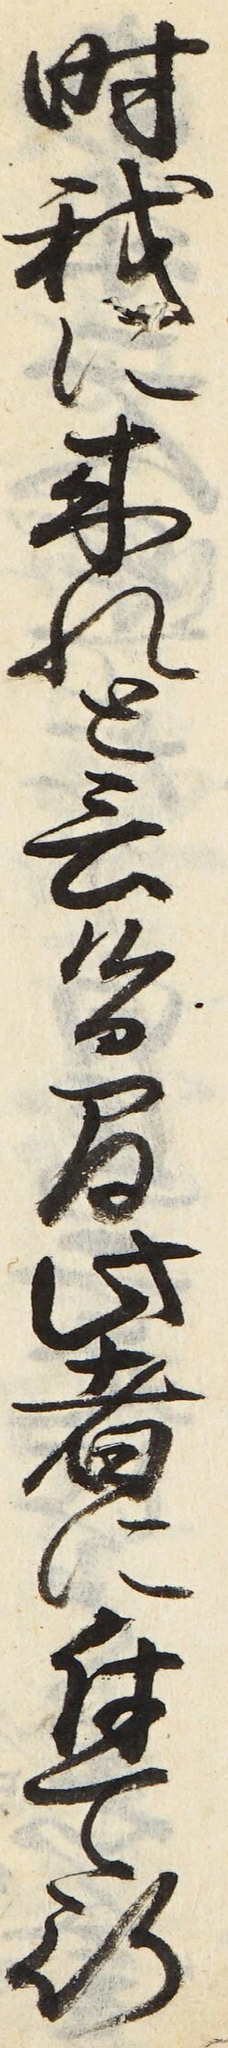時我に来れと云ける間此者に付て行
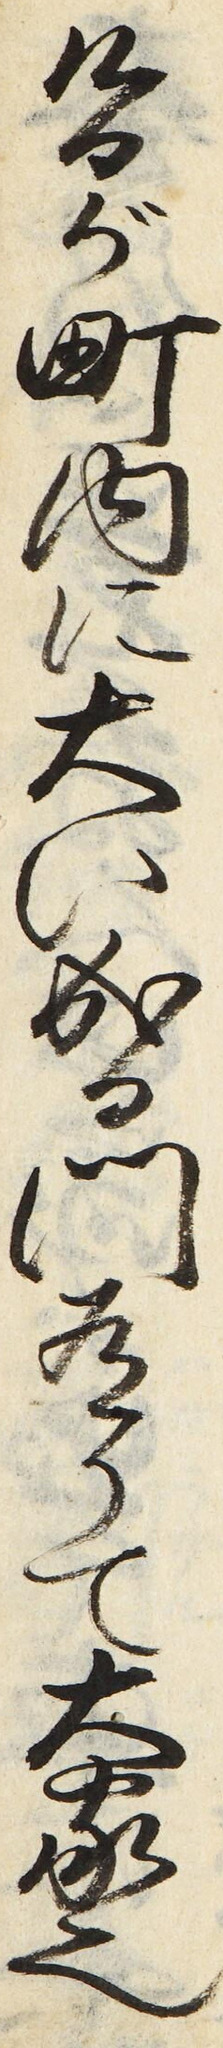けるが町内に大い成る門有りて大家也

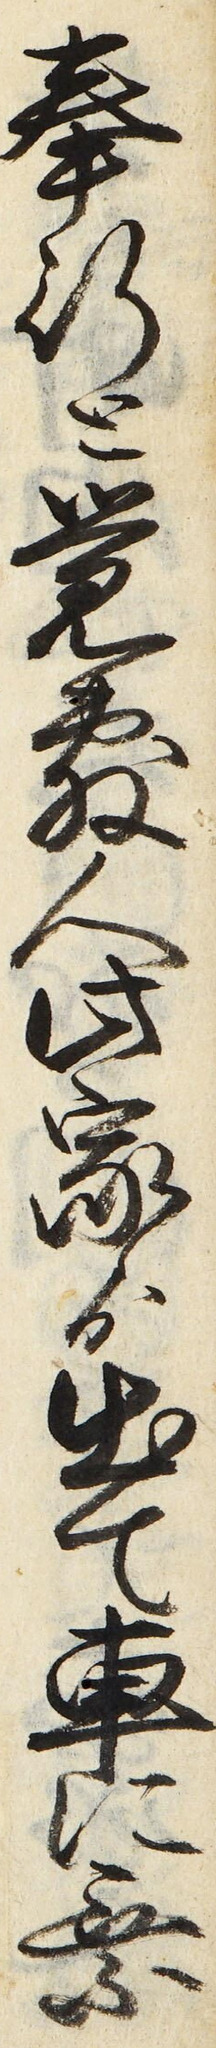奉行と覚敷人此家ゟ出て車に乗
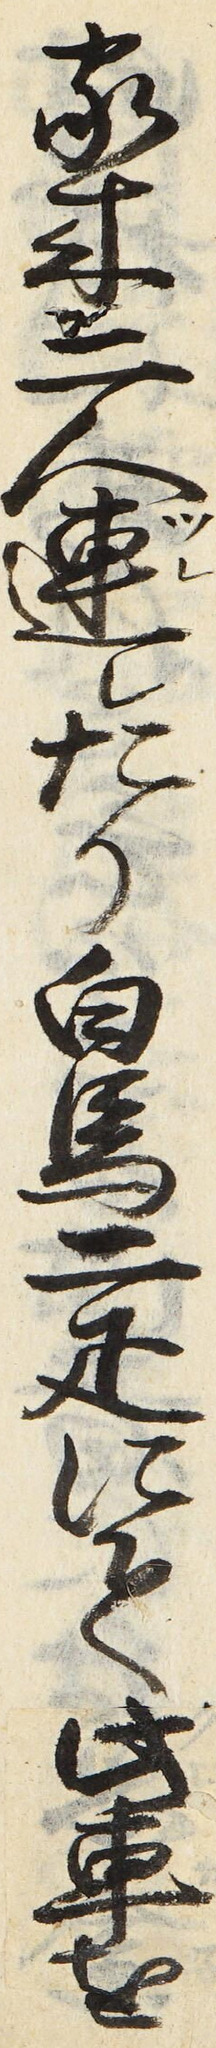家来二人連れたり白馬二疋にて此車を
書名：華夷九年録
